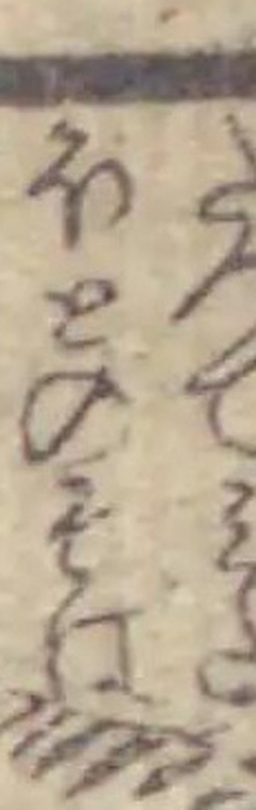ほとのそば
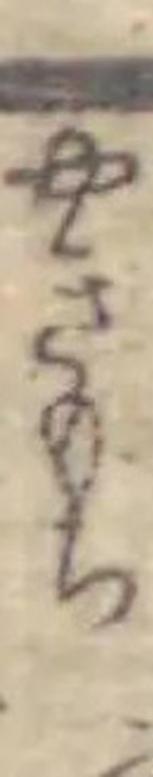やきもち
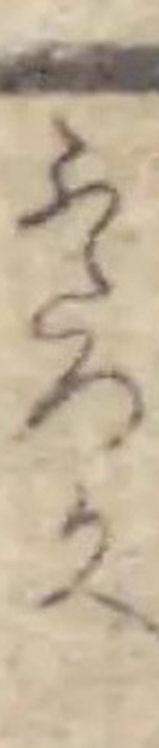ふたつかへ
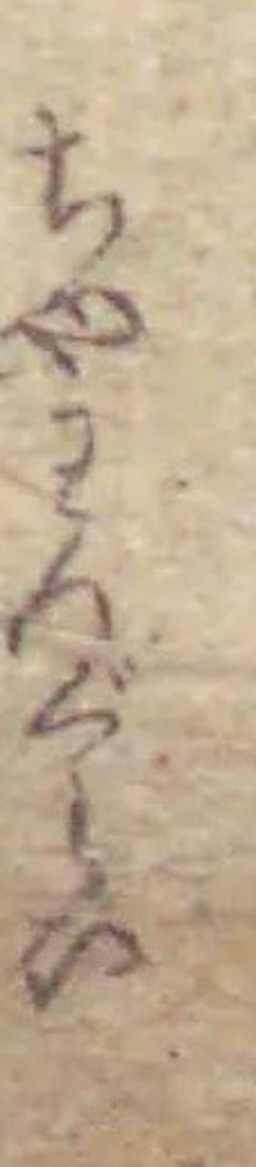ちやわんぐらい
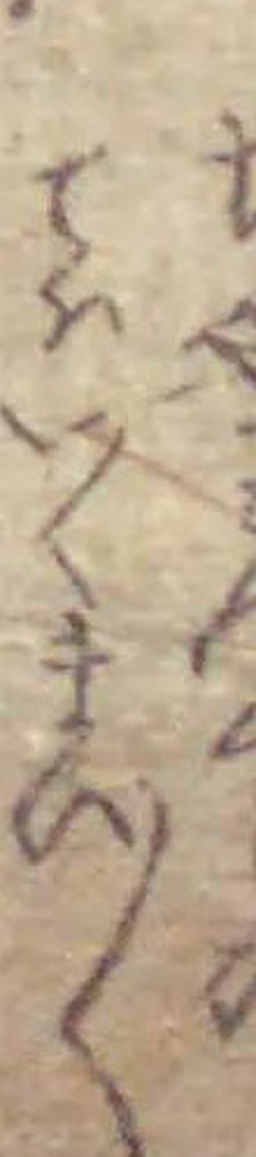てはいくまい〳〵
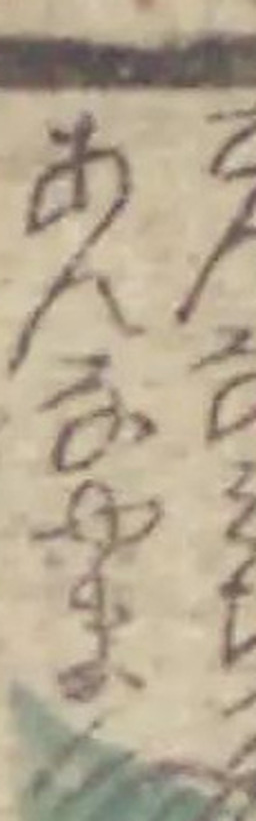あんなやま
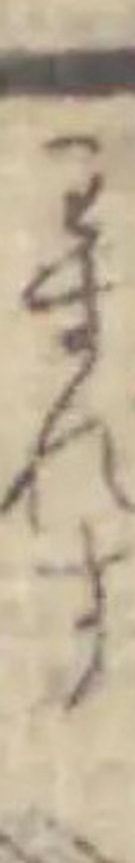わすれず
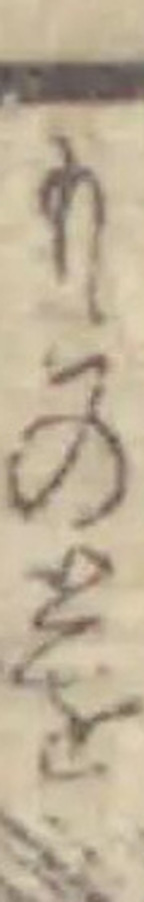もとのとを
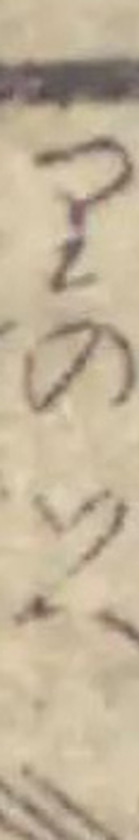りのいへ
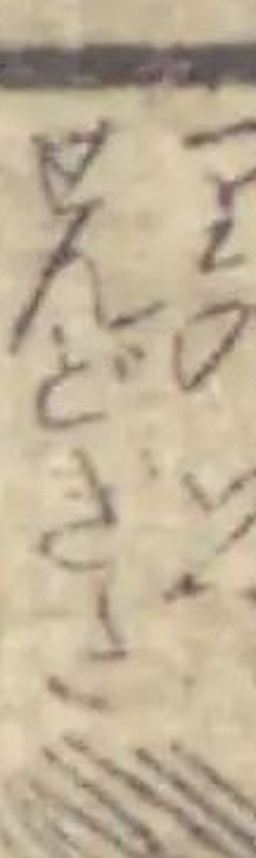せんどきた
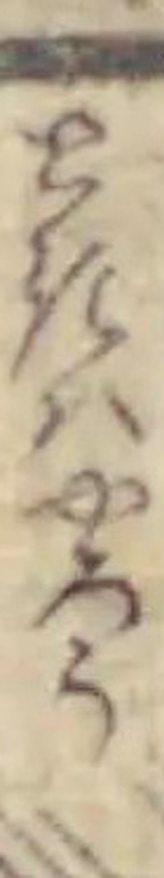ときはやろう
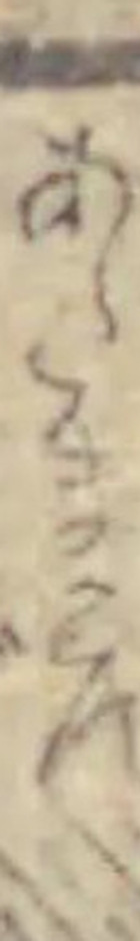あたまこん
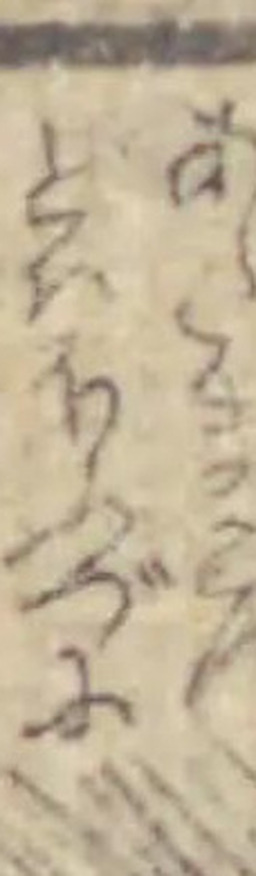とはほふづに
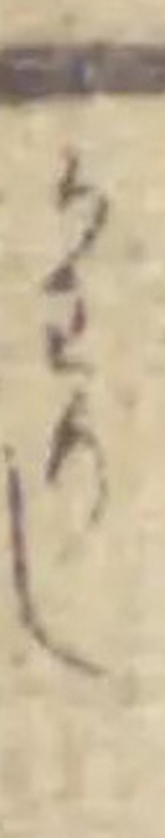かわりし
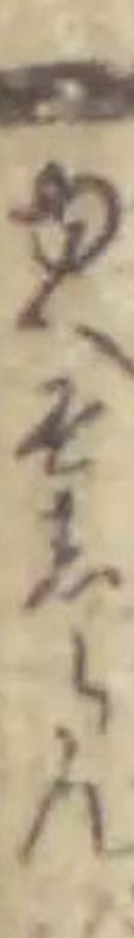ゆへそしらん
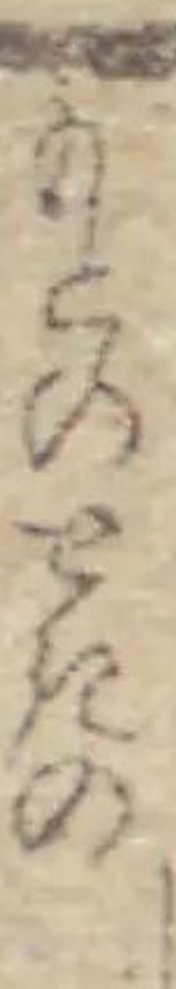もとのときの
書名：もふもふもふ怖噺 2巻
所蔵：国立国会図書館 National Diet Library, JAPAN
